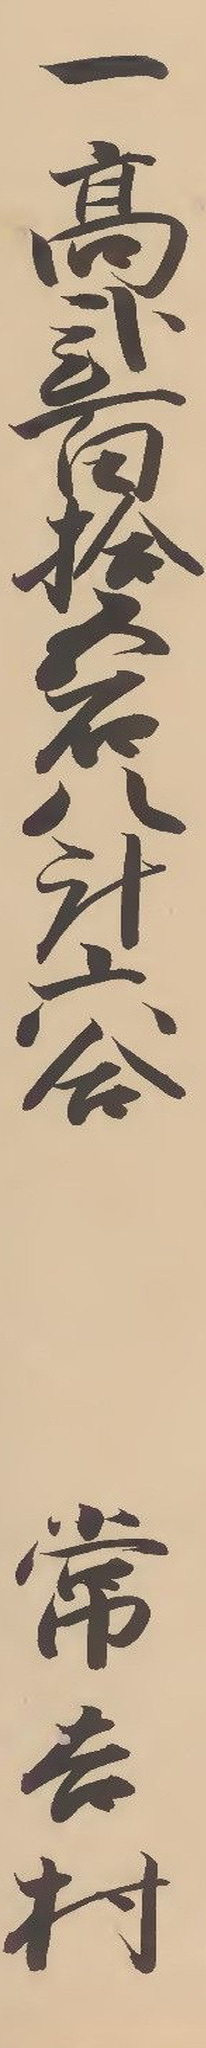一高弍百拾五石八斗六合常吉村
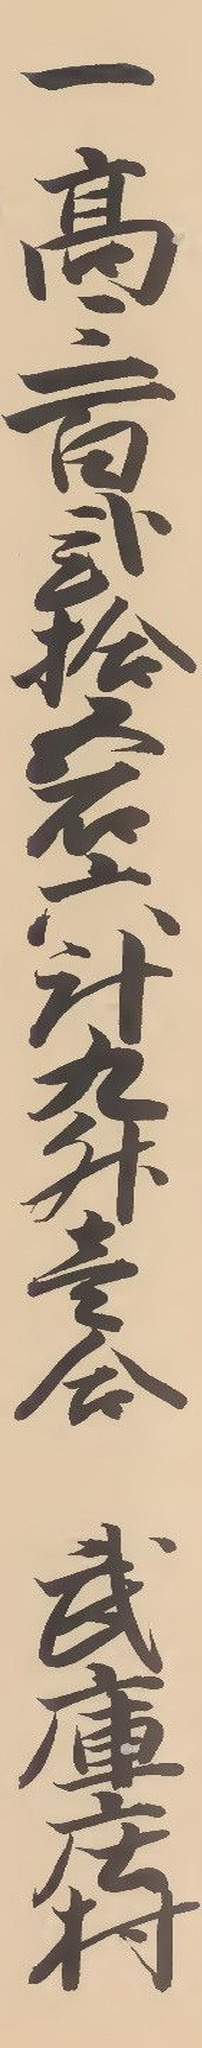一高三百弐拾五石六斗九升壱合武庫庄村
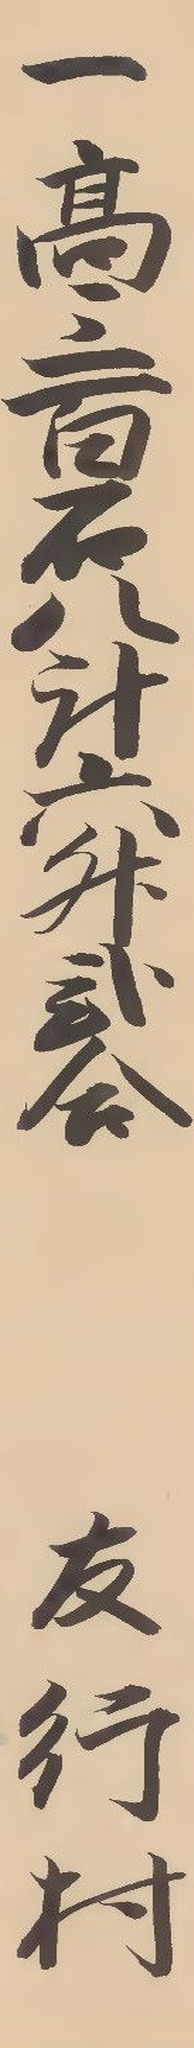一高三百石八斗六升弐合友行村
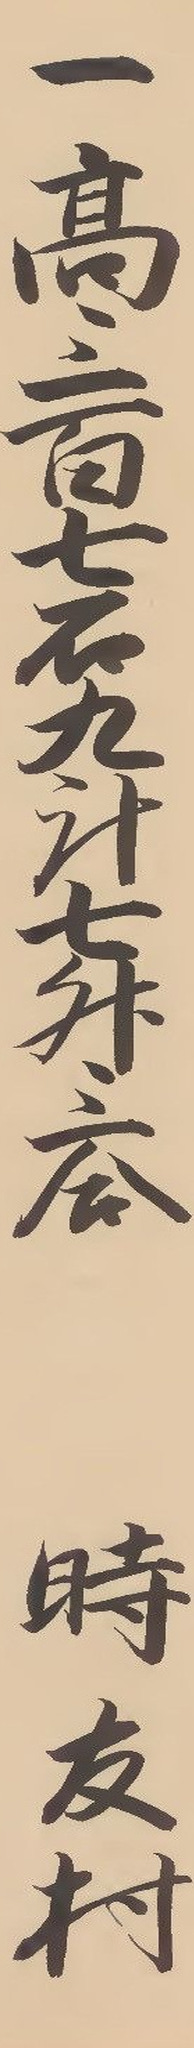一高三百七石九斗七升三合時友村
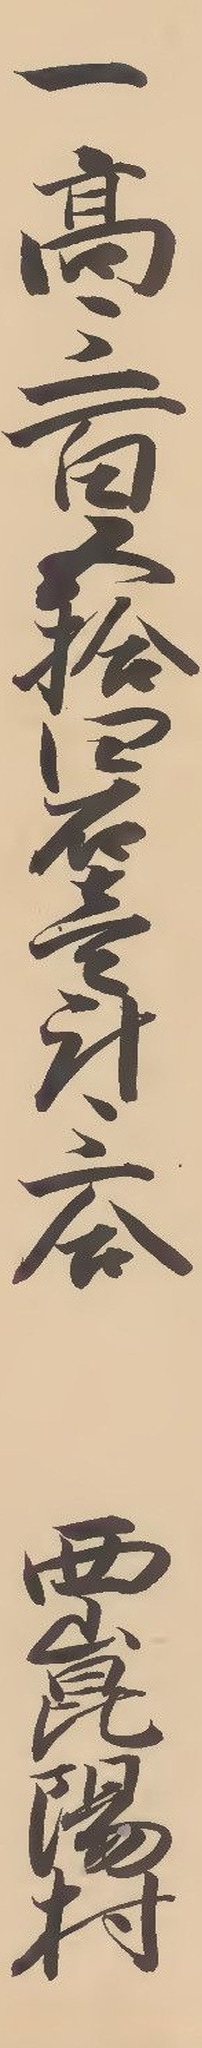一高三百五拾四石壱斗三合西崑陽村

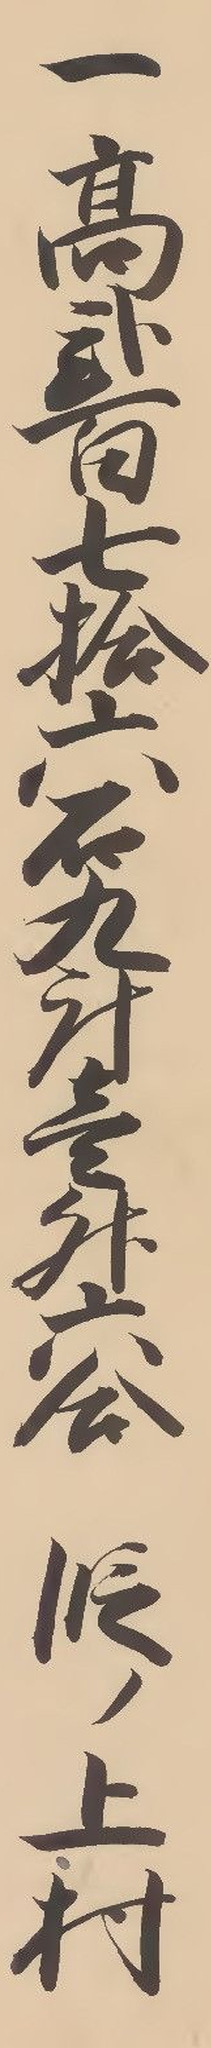一高弍百七拾六石九斗壱升六合段ノ上村
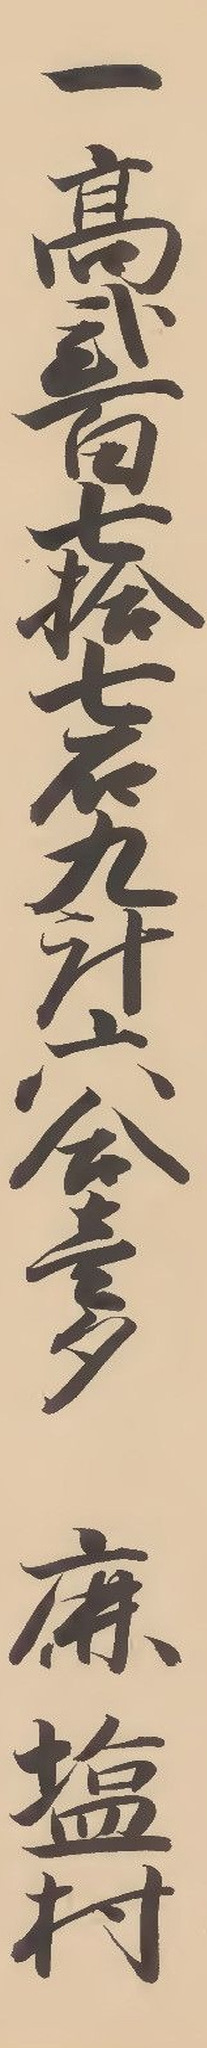一高弍百七拾七石九斗六合壱勺鹿塩村
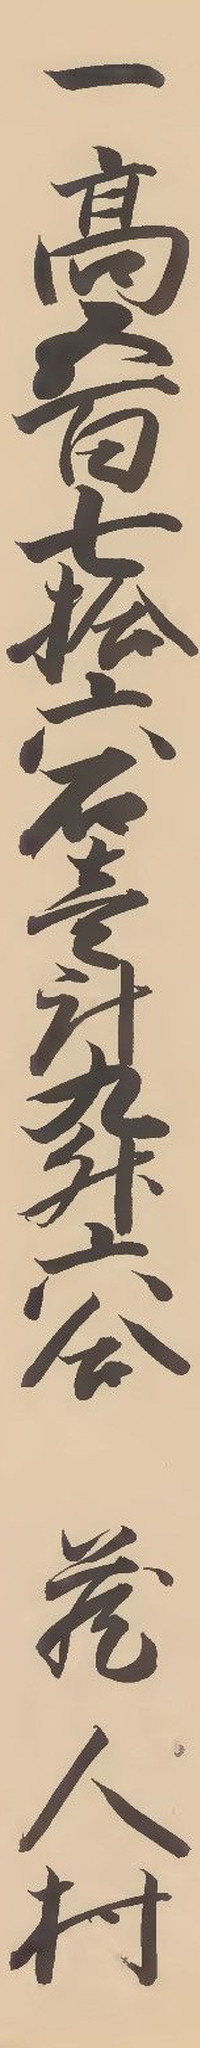一高五百七拾六石壱斗九升六合蔵人村
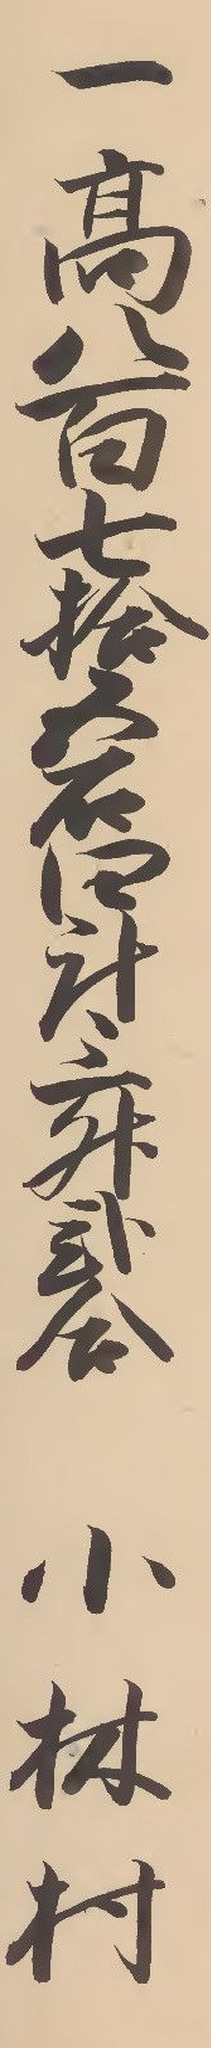一高八百七拾五石四斗三升弍合小林村
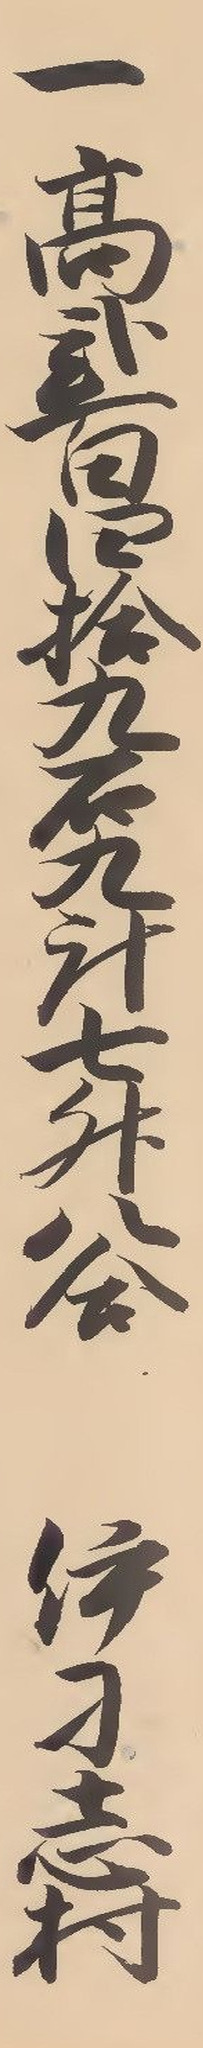一高弍百四拾九石九斗七升八合伊孑志村
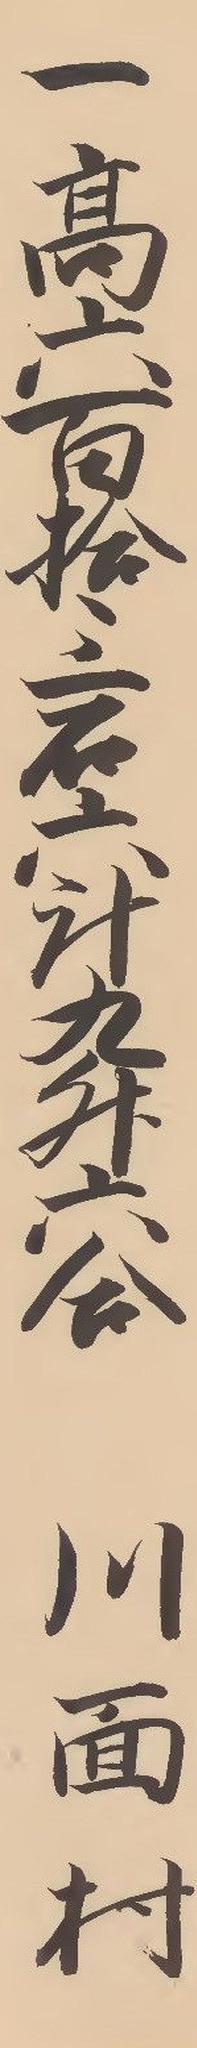一高六百拾三石六斗九升六合川面村
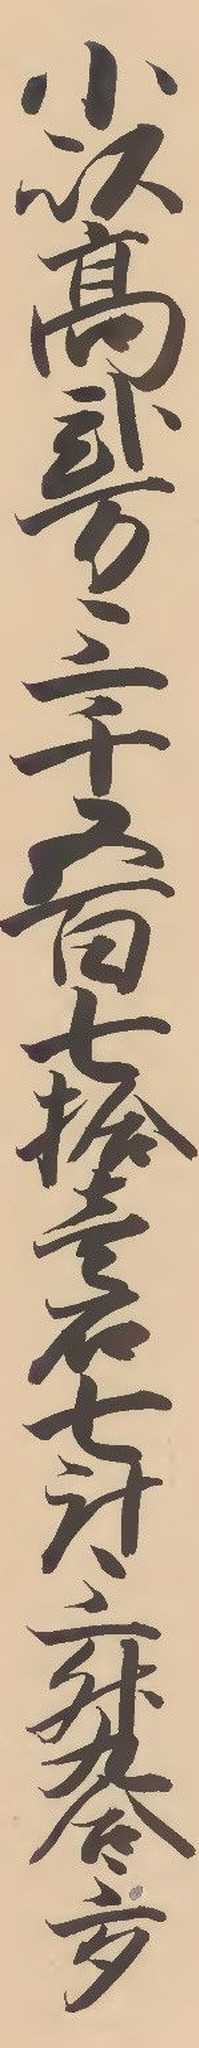小以高弍万三千五百七拾壱石七斗三升九合三勺

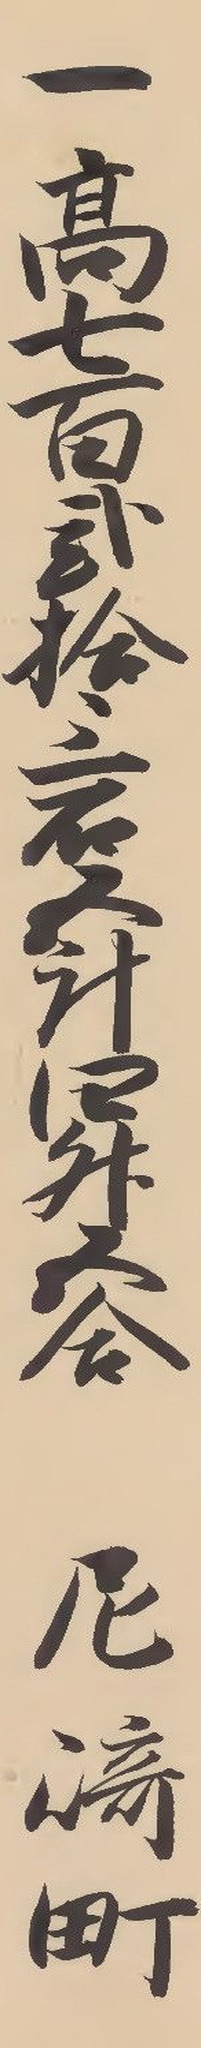一高七百弐拾三石五斗四升五合尼崎町
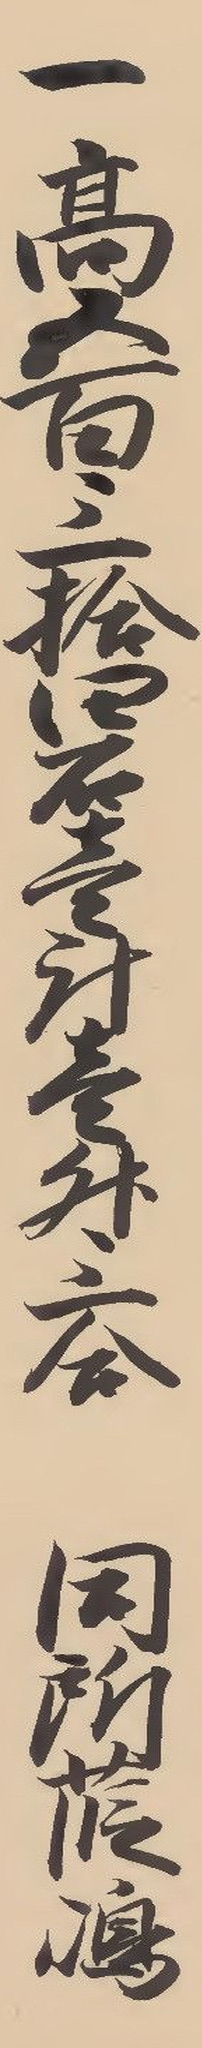一高五百三拾四石壱斗壱升三合同所葭島
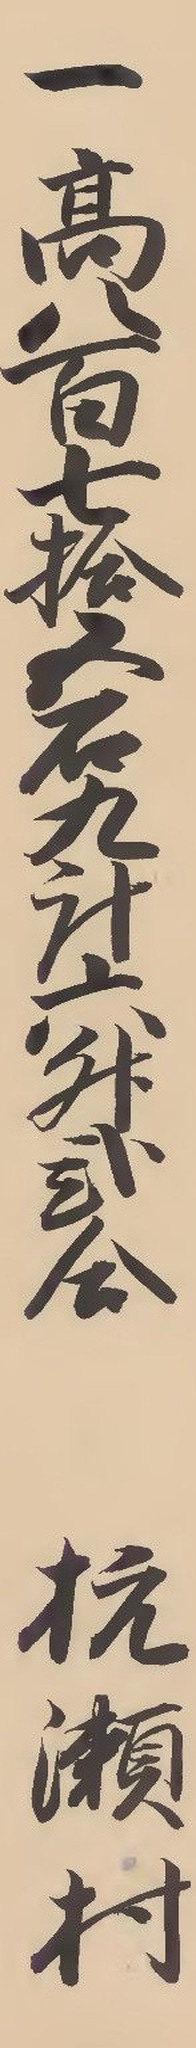一高八百七拾五石九斗六升弐合杭瀬村

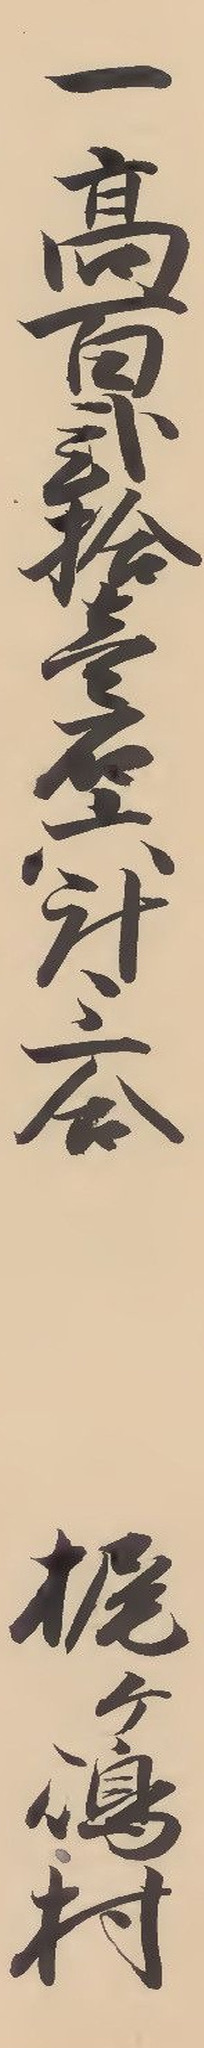一高百弐拾壱石六斗三合梶ケ島村
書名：摂津国郷帳
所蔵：国立公文書館 National Archives of Japan
